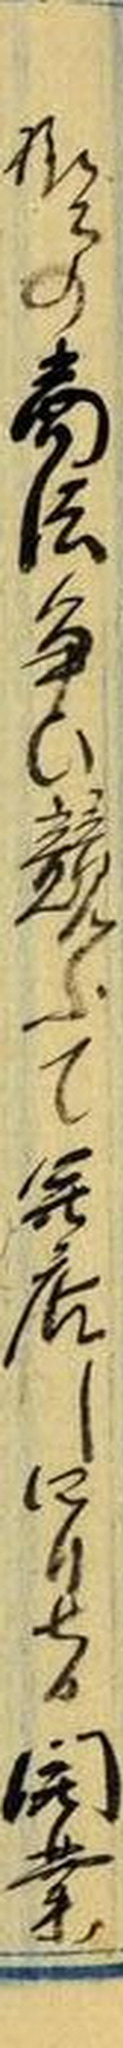様々の商法争ひ競ふて開店し四月七日開業
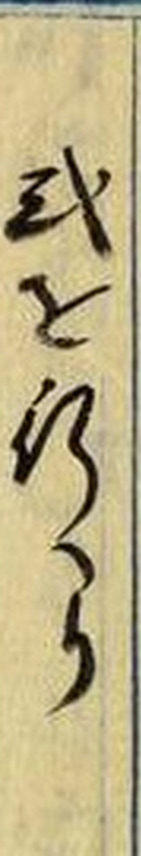式を行へり
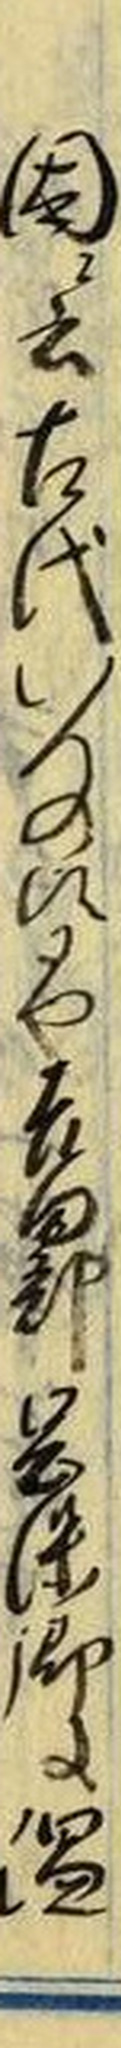因に云古代いつの頃にや吉田郡岡保郷に温
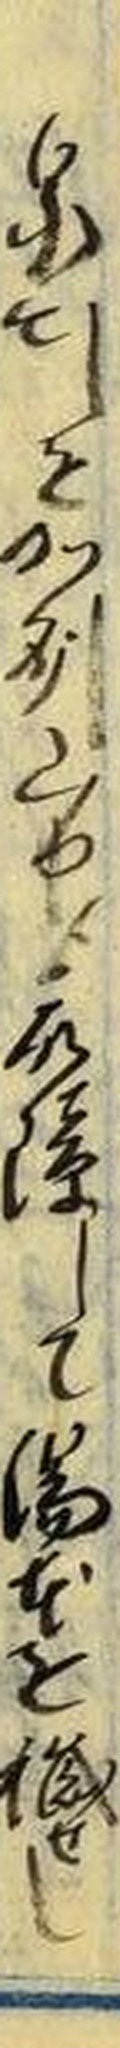泉出しを加州山中ゟ故障して湯本を穢せし
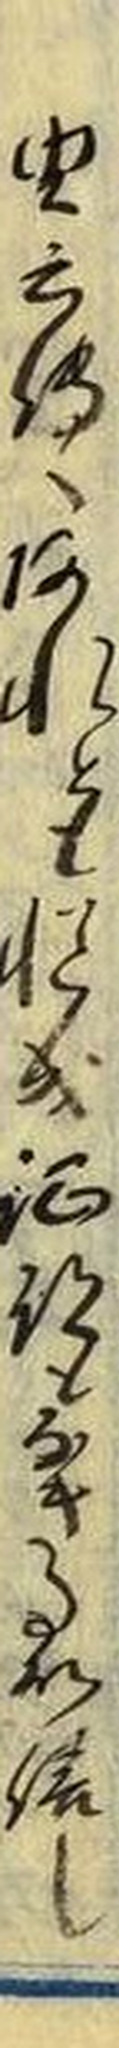由言伝へあれとも慥成証跡もなき事故信し
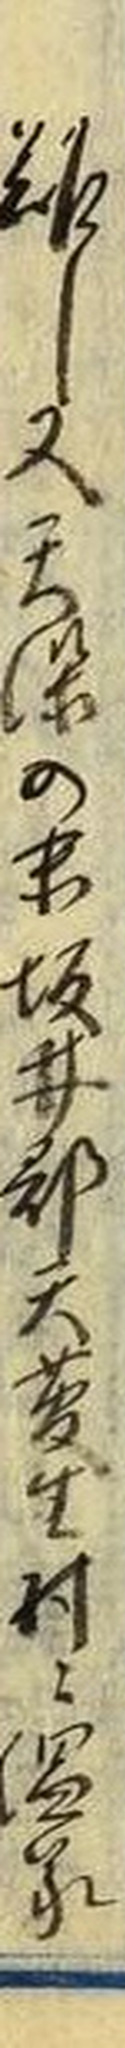難し又天保の末坂井郡天菅生村に温泉
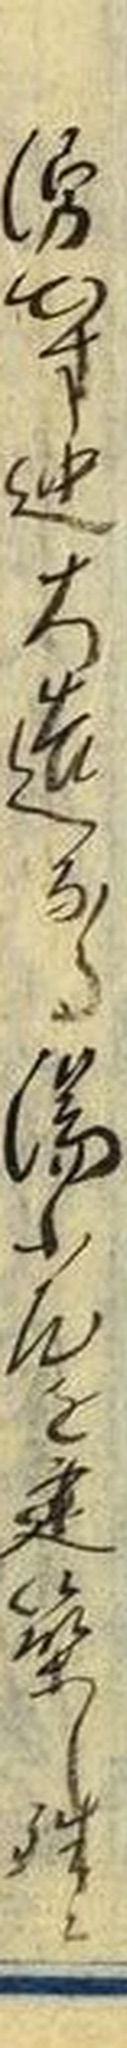湧出す迚大造なる湯小屋を建築し殊に
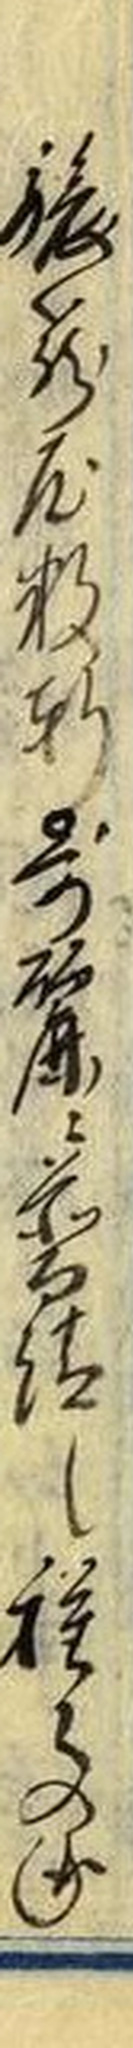旅籠屋数軒寄麗に普請し種々の趣
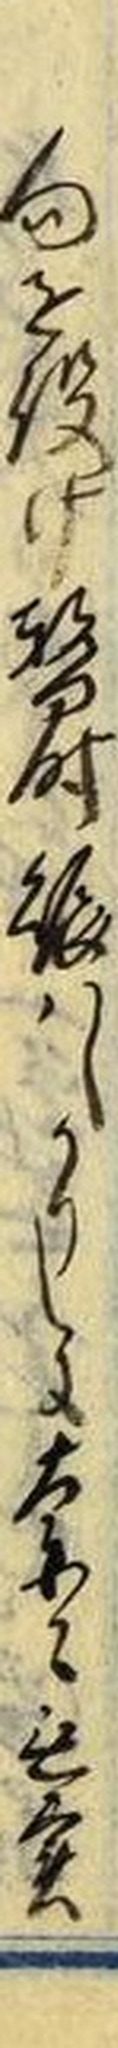向を設け暫時賑はしかりしに素々無実
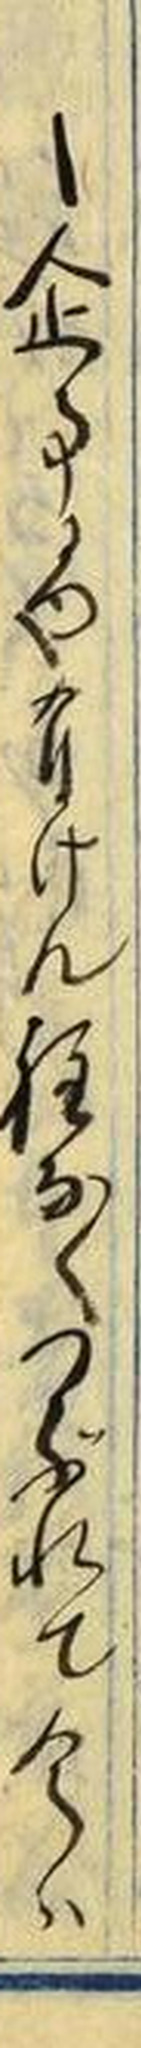之企事にや有けん程なくつぶれて今は

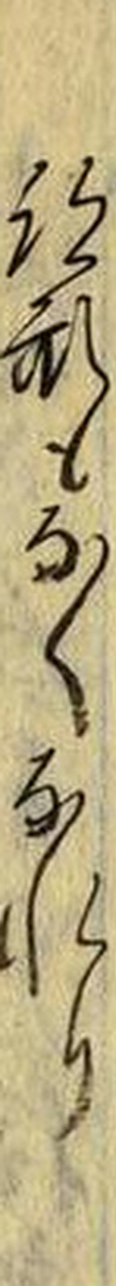跡形もなくなれり
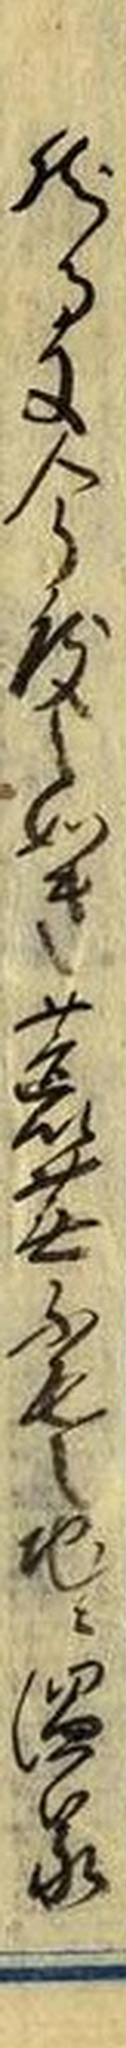然るに今度之如き荒蕪不毛之地に温泉
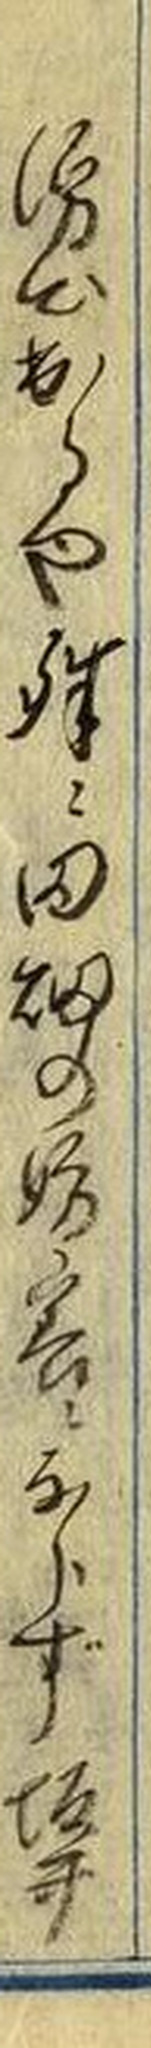湧出出るや殊に田畑の妨害にならず坂井
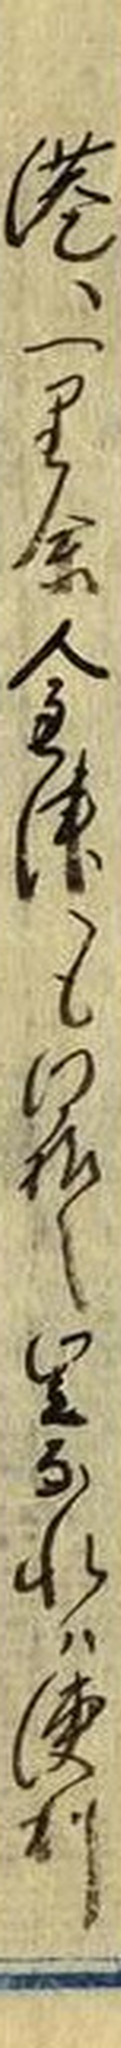港へ一里余金津へも同様之里なれは便利
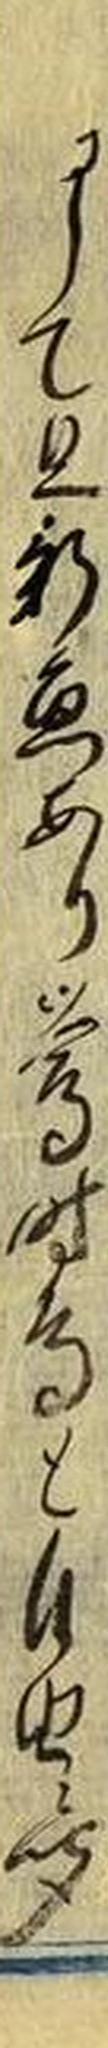にして且新魚あり鴬時鳥も自由に聞
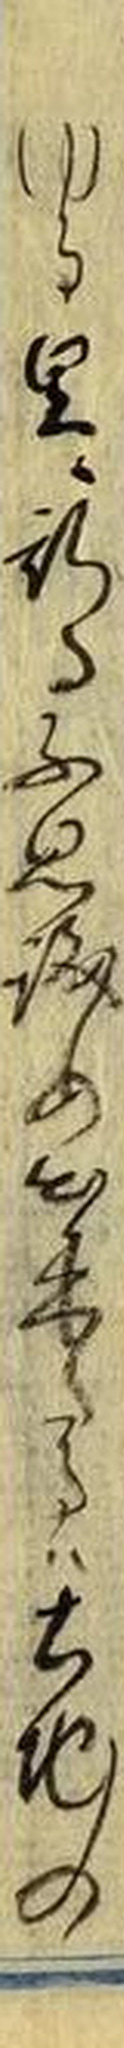ゆる里へ斯る不思議の出来たるは土地の
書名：温古集 五巻
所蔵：福井県文書館 Fukui Prefectural Archives
